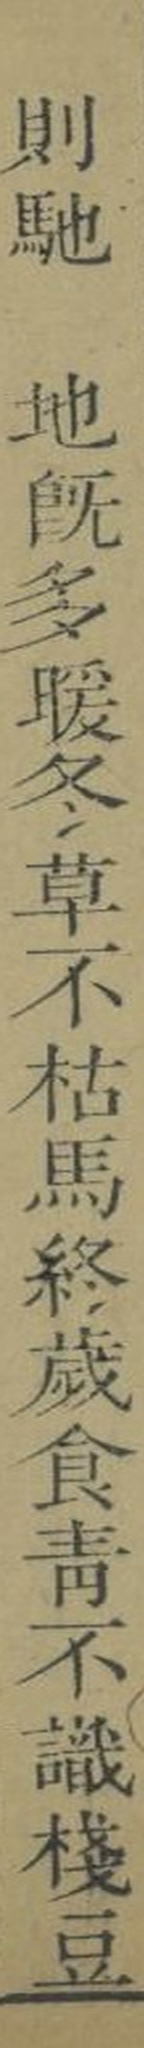則馳地既多暖冬草不枯馬終歳食青不識桟豆
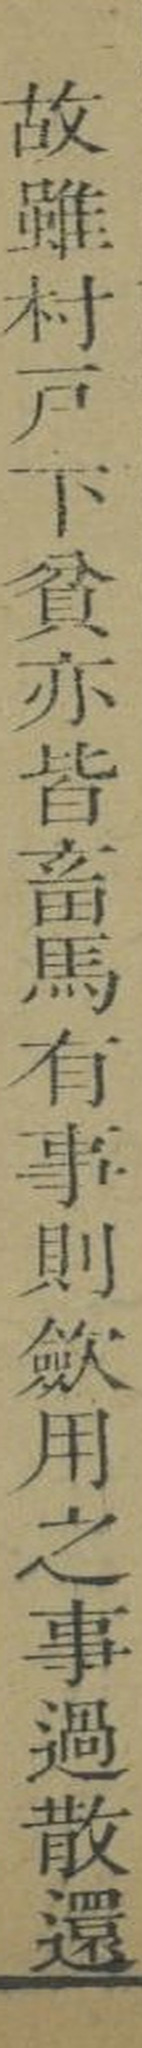故雖村戸下貧亦皆畜馬有事則歛用之事過散還
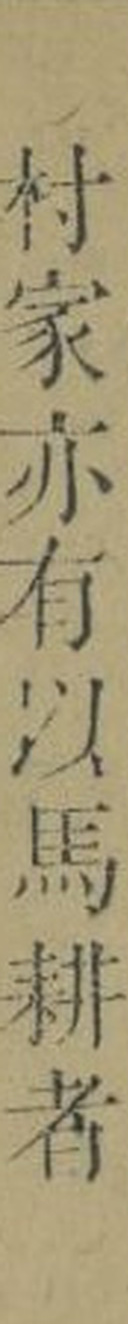村家亦有以馬耕者
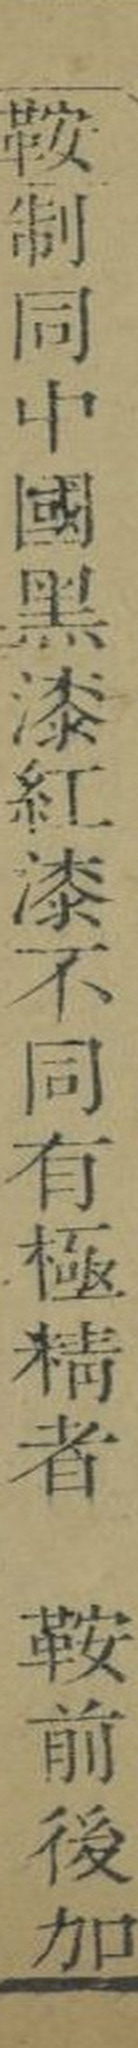[鞍]制同中国黒漆紅漆不同有極精者鞍前後加
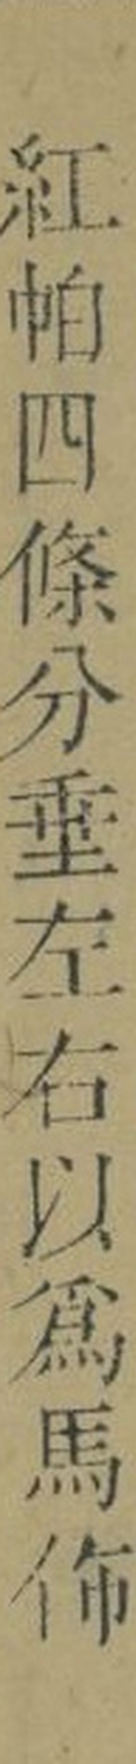紅帕四条分垂左右以為馬飾
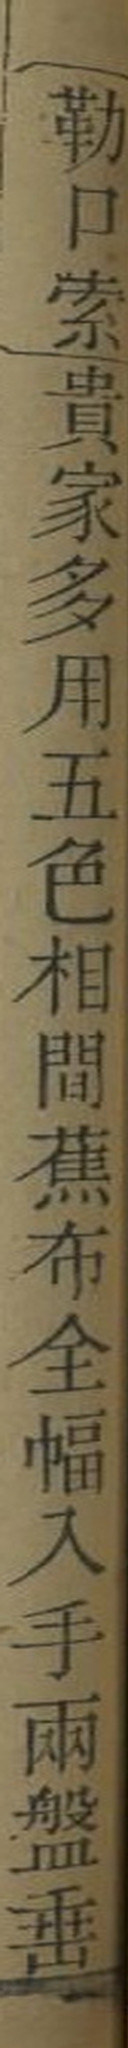[勒口索]貴家多用五色相間蕉布全幅入手両盤垂
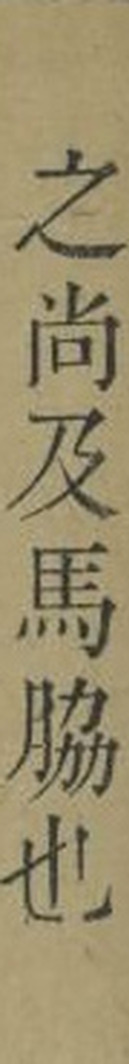之尚及馬脇也
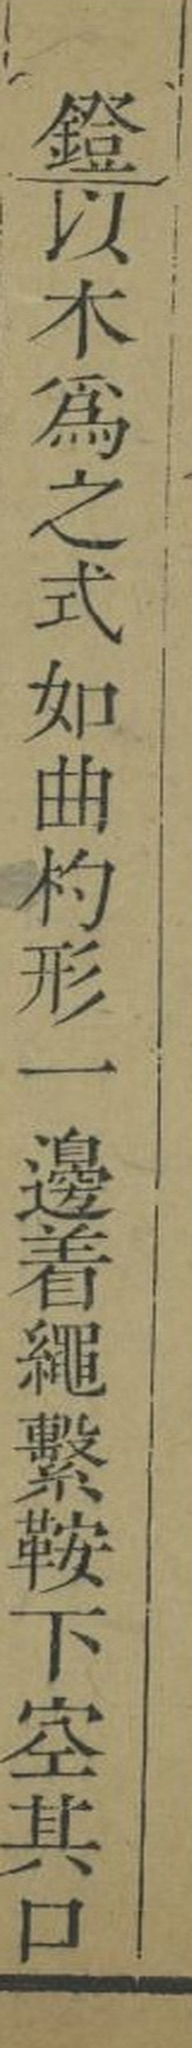[鐙]以木為之式如曲杓形一辺着縄繋鞍下空其口
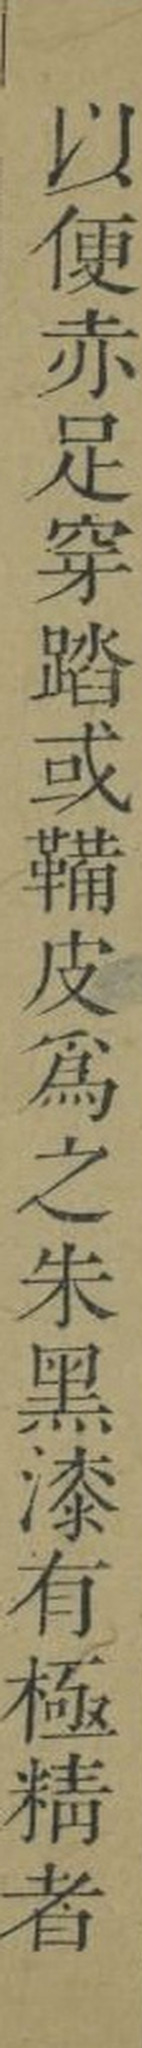以便赤足穿踏或鞴皮為之朱黒漆有極精者
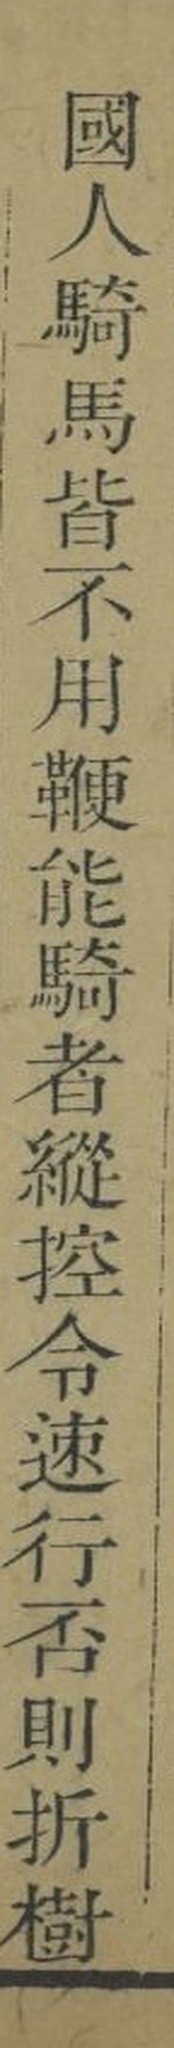国人騎馬皆不用鞭能騎者縦控令速行否則折樹
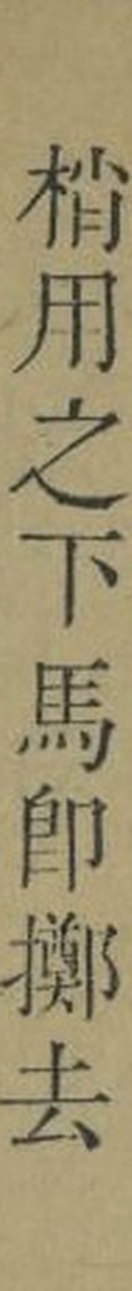梢用之下馬即擲去
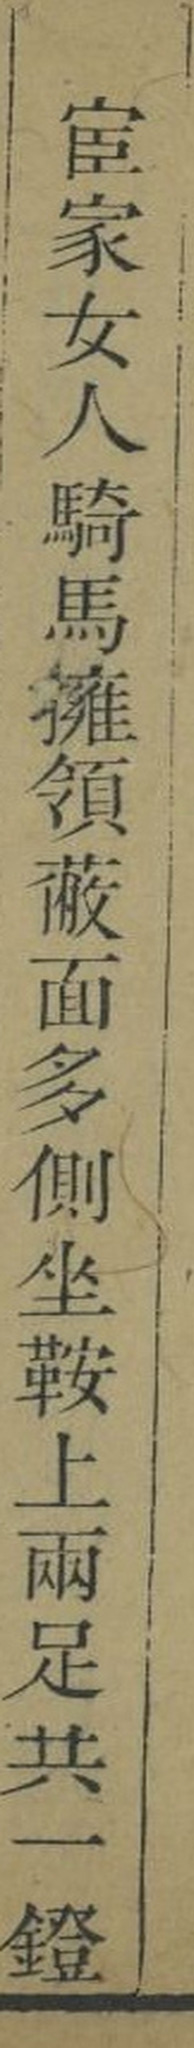宦家女人騎馬擁領蔽面多側坐鞍上両足共一鐙
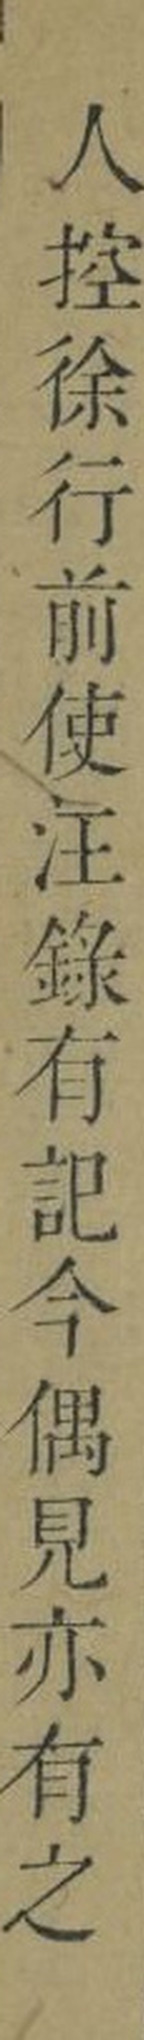人控徐行前使汪録有記今偶見亦有之

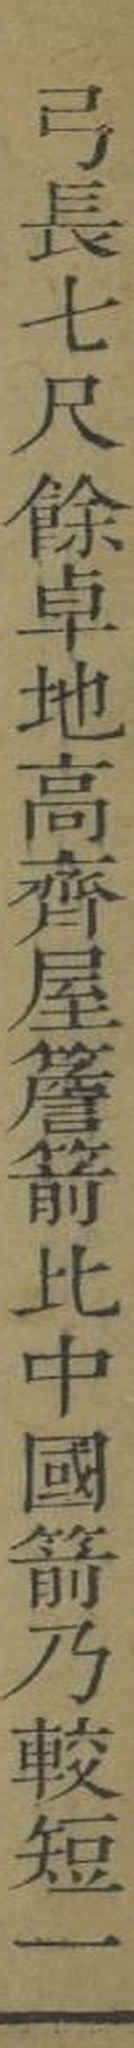弓長七尺余卓地高斉屋簷箭比中国箭乃較短一
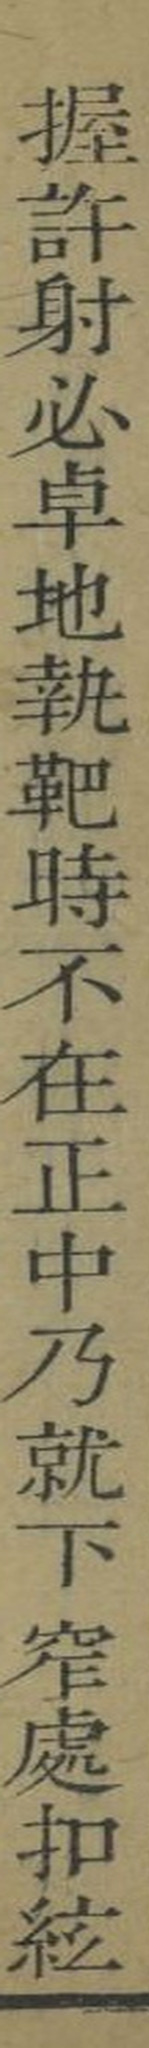握許射必卓地執靶時不在正中乃就下窄処扣絃
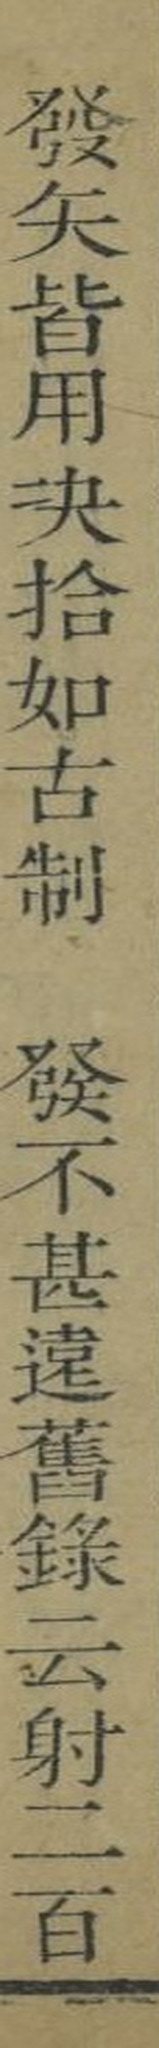発矢皆用決拾如古制発不甚遠旧録云射二百
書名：中山伝信録 巻六
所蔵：University of the Ryukyus Library
